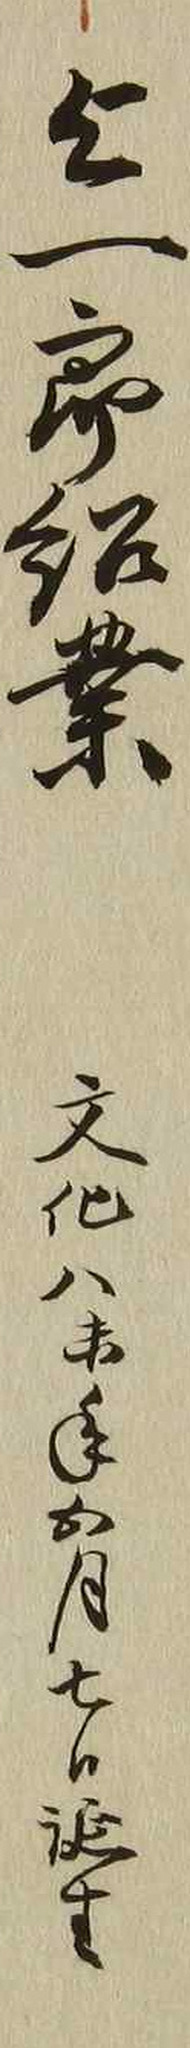与一郎紹業文化八未年五月七日誕生
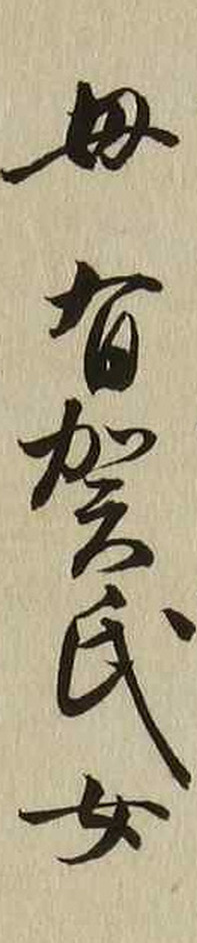母有賀氏女
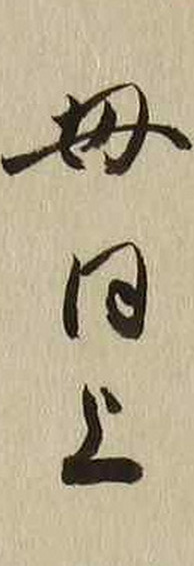母同上
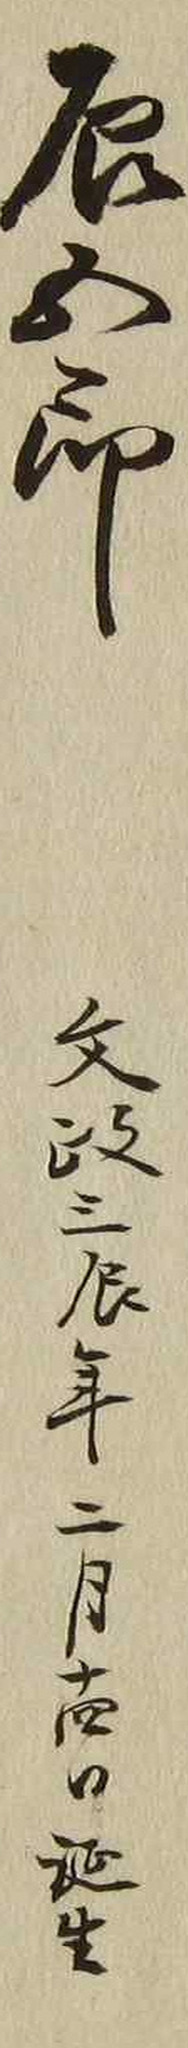辰五郎文政三辰年ニ月十四日誕生
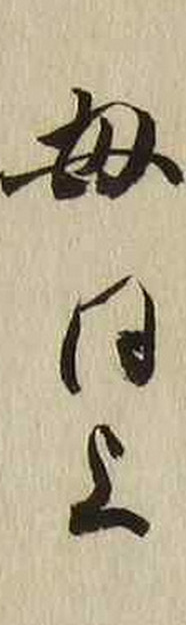母同上
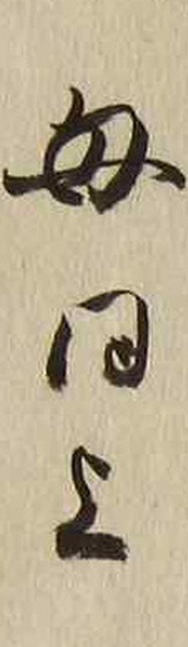母同上

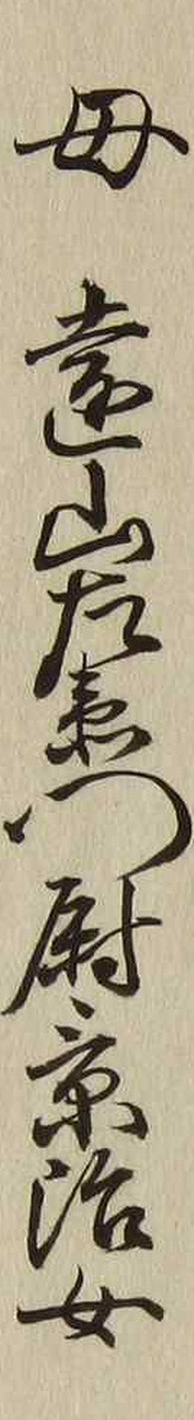母遠山左衛門尉景治女
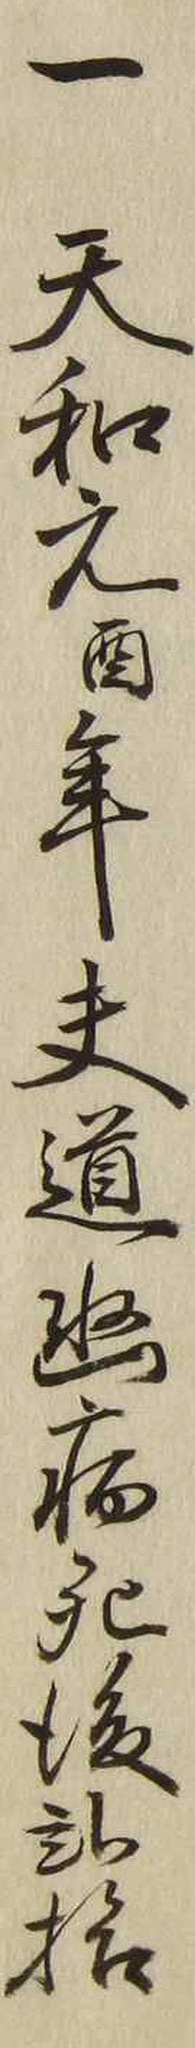一天和元酉年夫道幽病死後弐拾

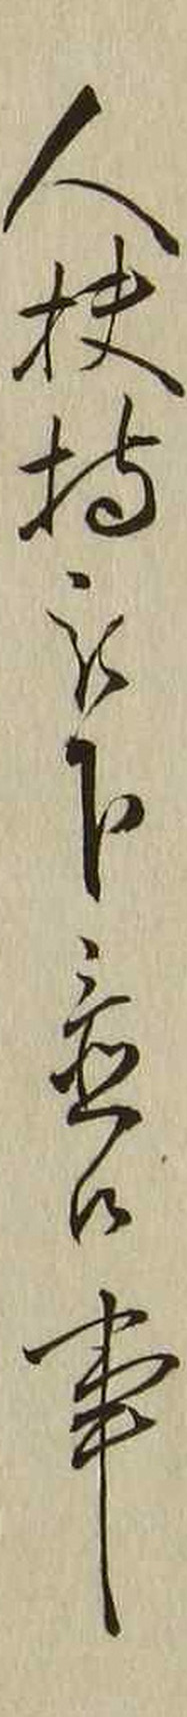人扶持被下置候事
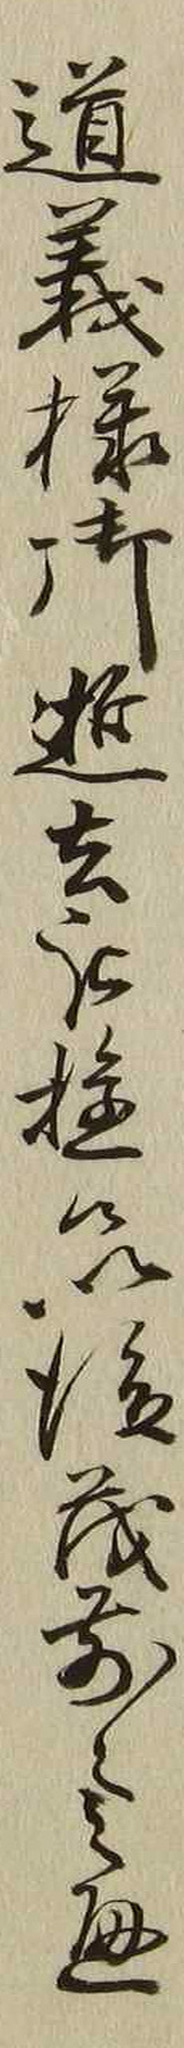道義様御逝去被遊候以後も前々之通
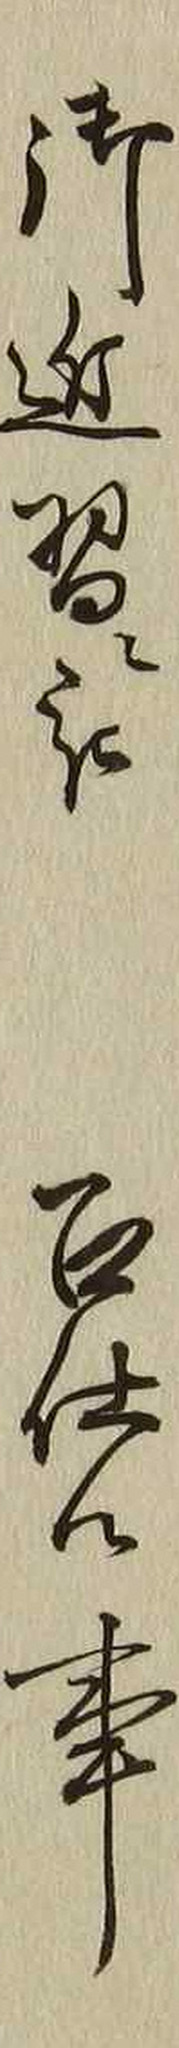御近習ニ被召仕候事
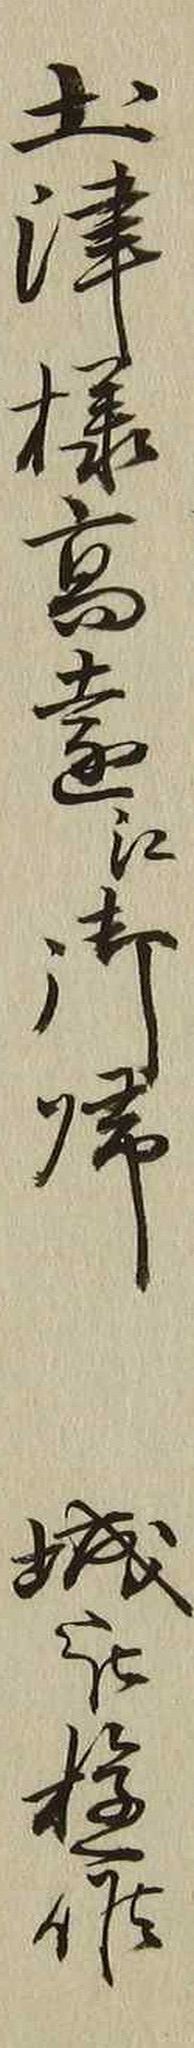土津様高遠江御帰城被遊候
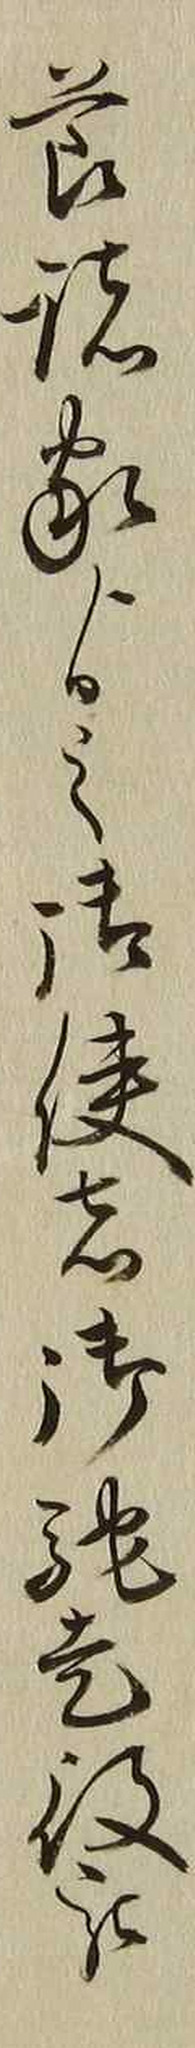節諸家ゟ之御使者御馳走役被
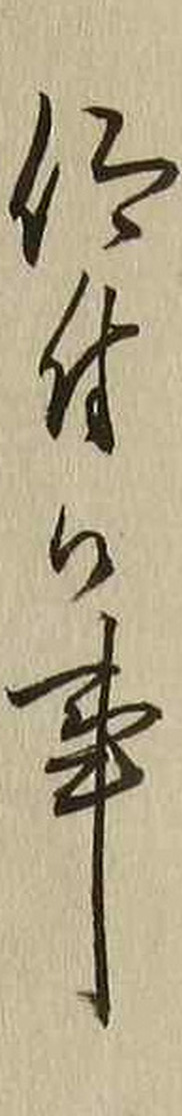仰付候事
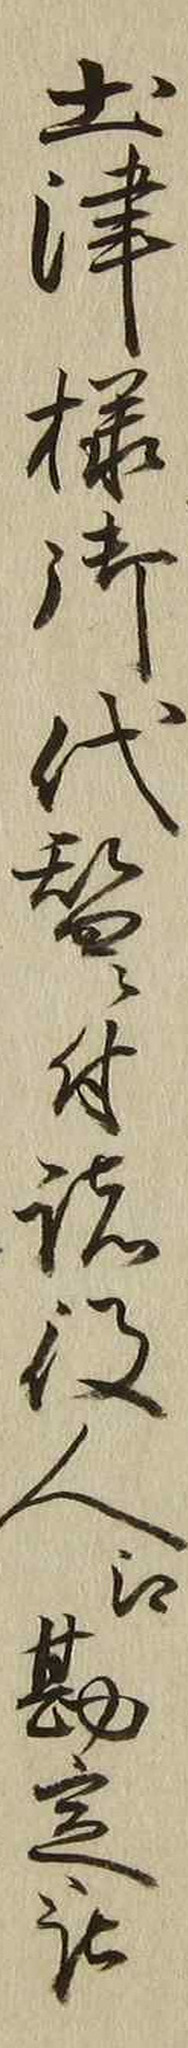土津様御代替ニ付諸役人江勘定被
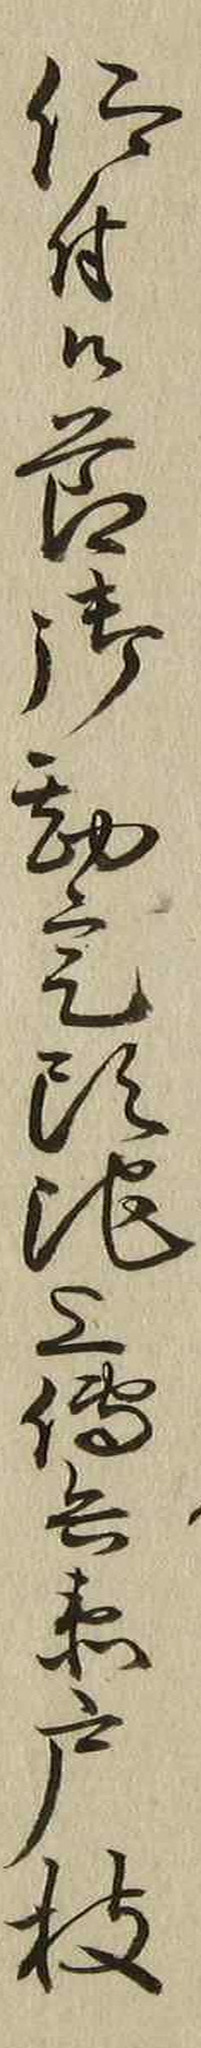仰付候節御勘定頭池上伝兵衛戸枝
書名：諸士系譜　巻之60　と之部3
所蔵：会津若松市立会津図書館
